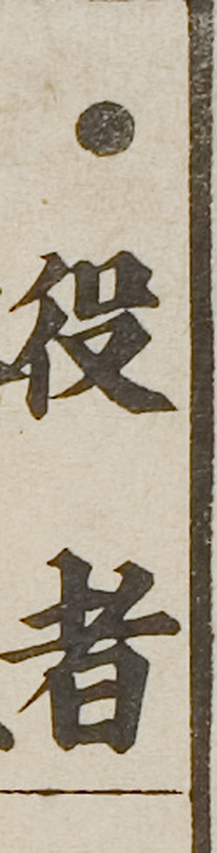●役者
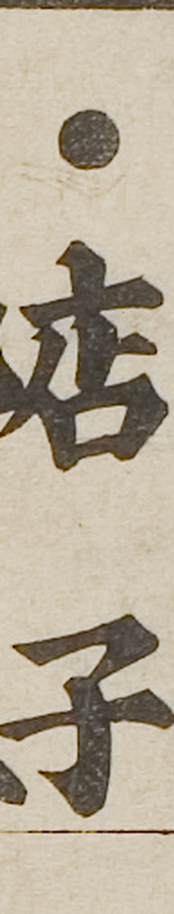●店子
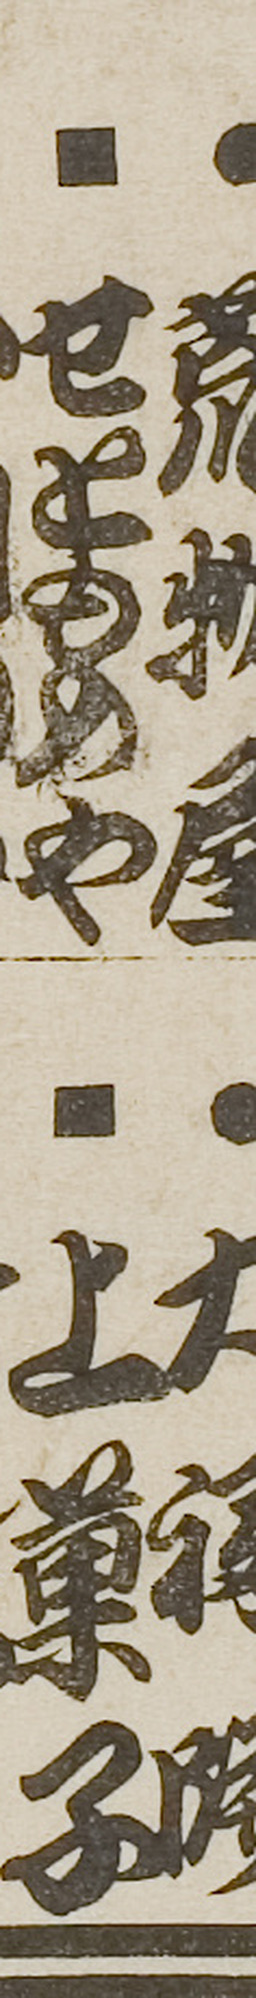▲せとものや
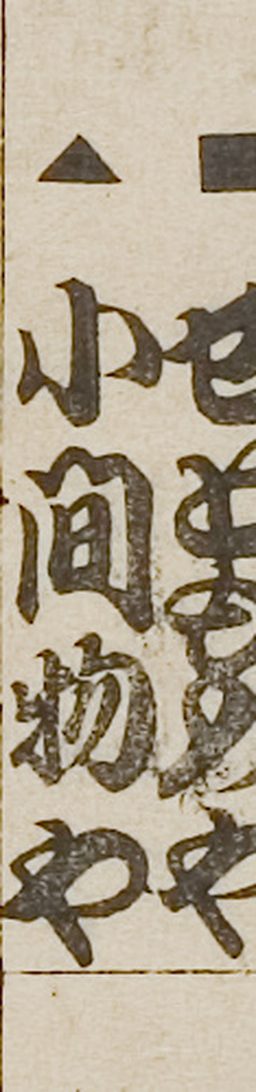小間物や
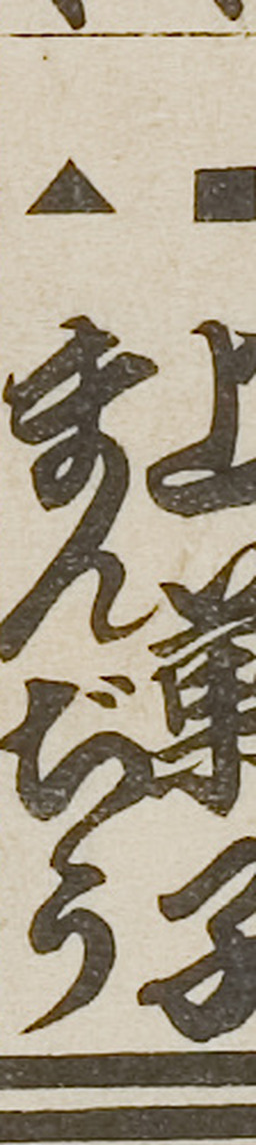まんぢう
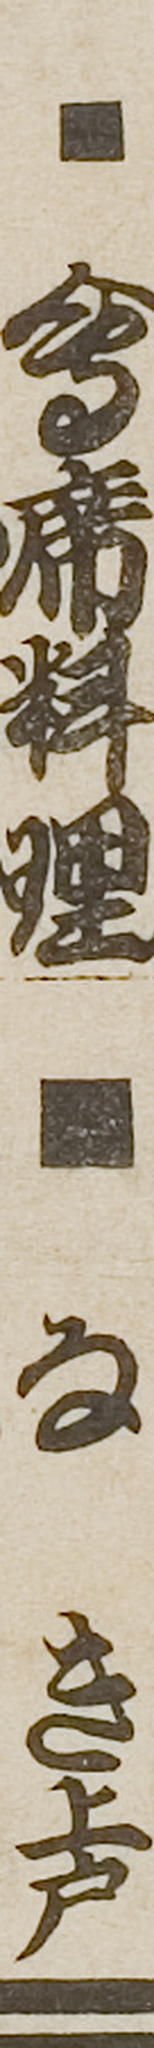▲會席料理
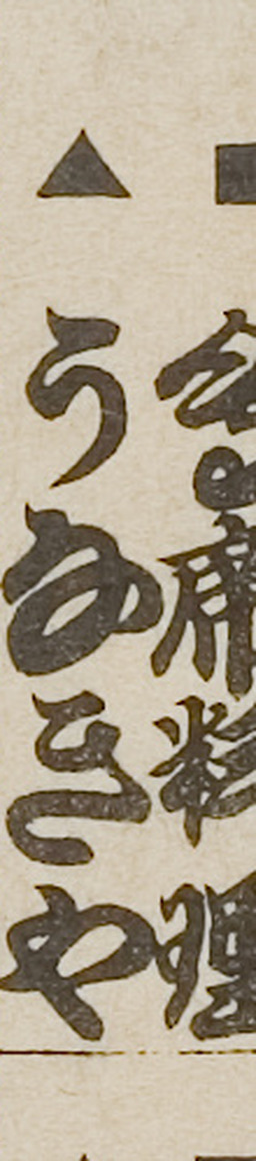うなきや
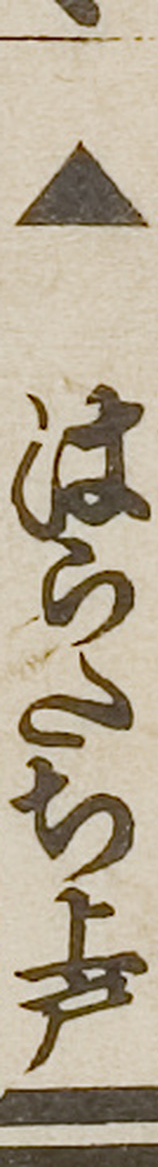はらたち上戸
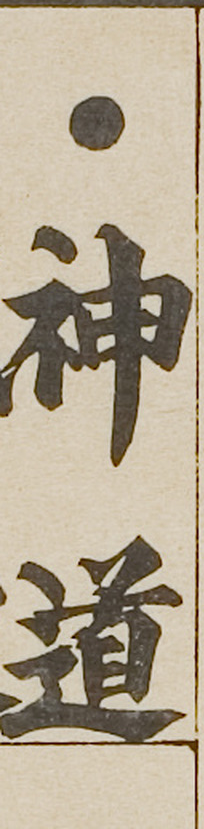●神道
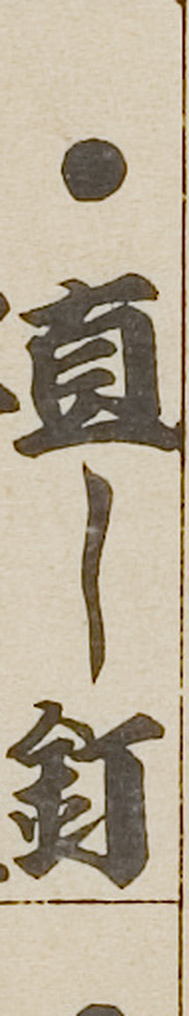●直し釘
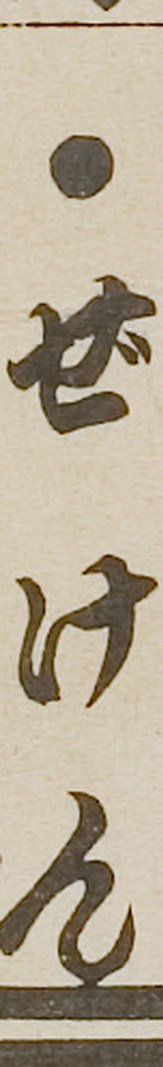●ぜけん
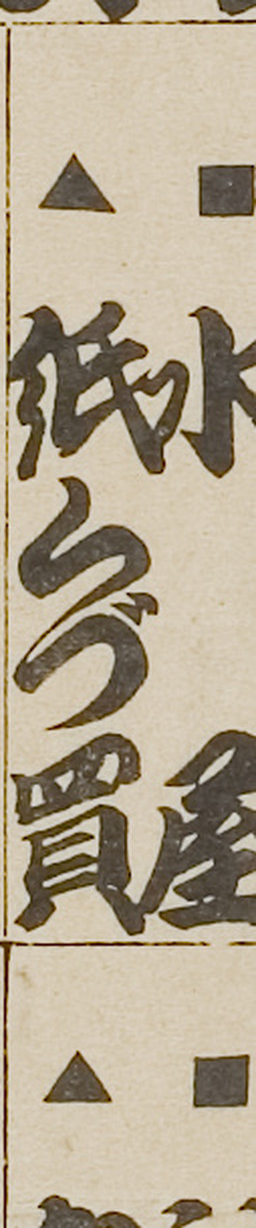紙くづ買
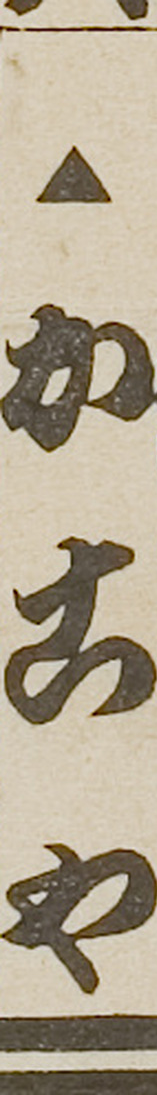かこや
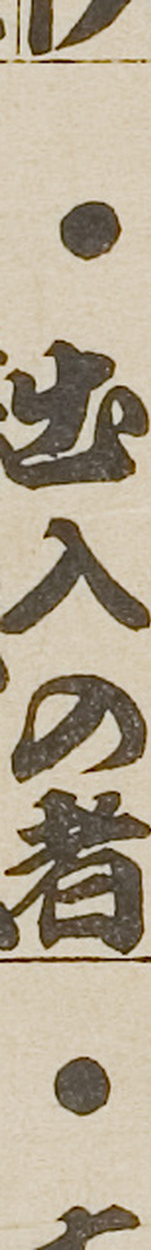●出入の者
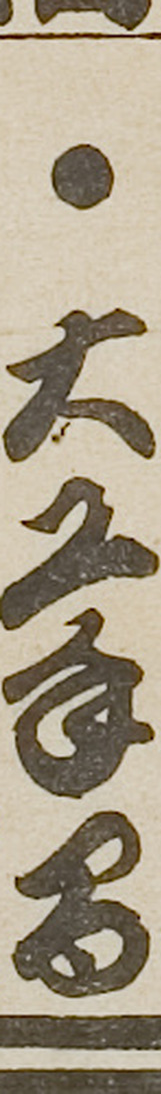●大工手間
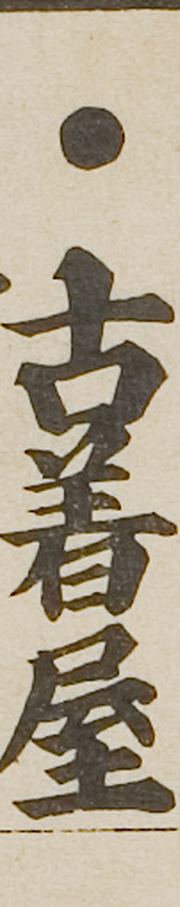●古着屋
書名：江戸大地震当座見立三人生酔
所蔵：東京大学総合図書館 General Library in the University of Tokyo, JAPAN
